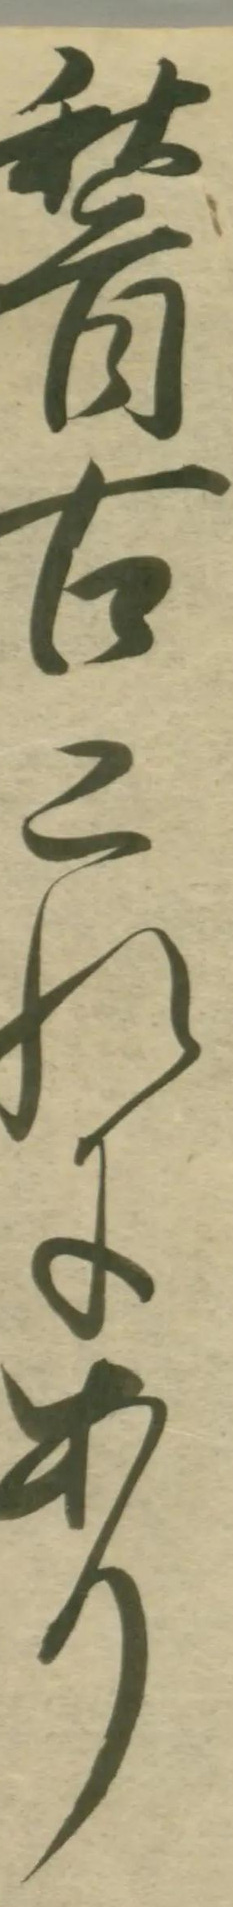稽古これにあり
